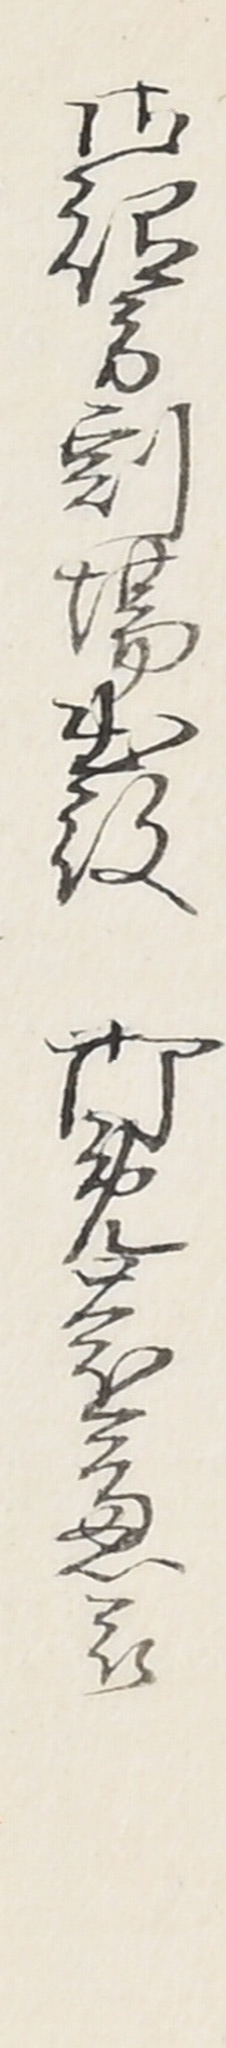御賄方割場出役御免遠慮被
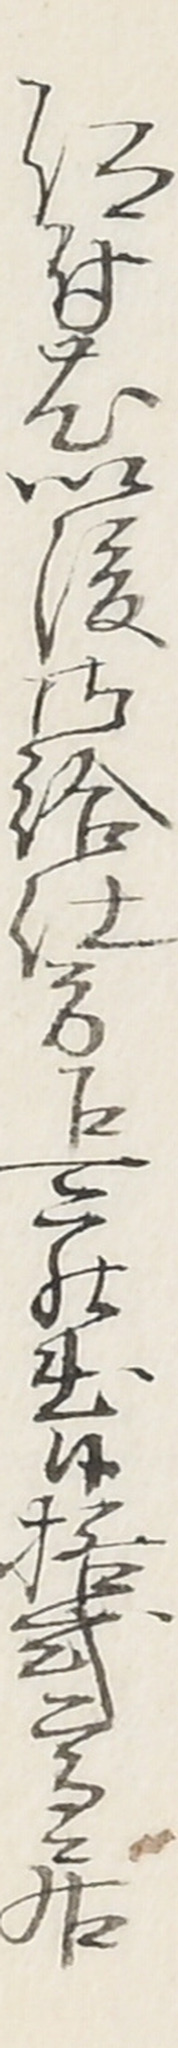仰付尤以後御給仕方江可罷出候格式高居
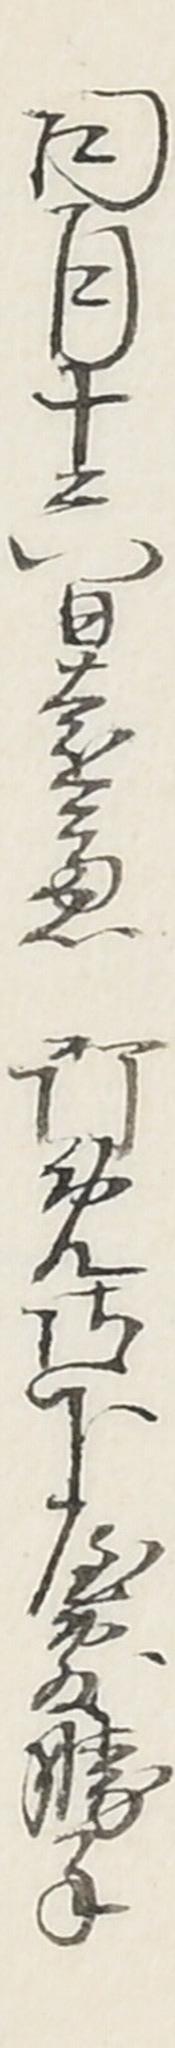同月十六日遠慮御免御下屋敷勝手
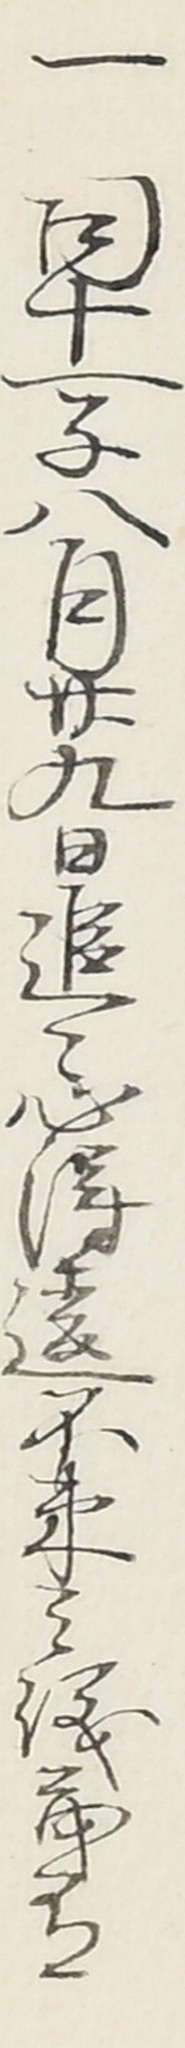一同十一子八月廿九日追々心得違不束之儀茂有
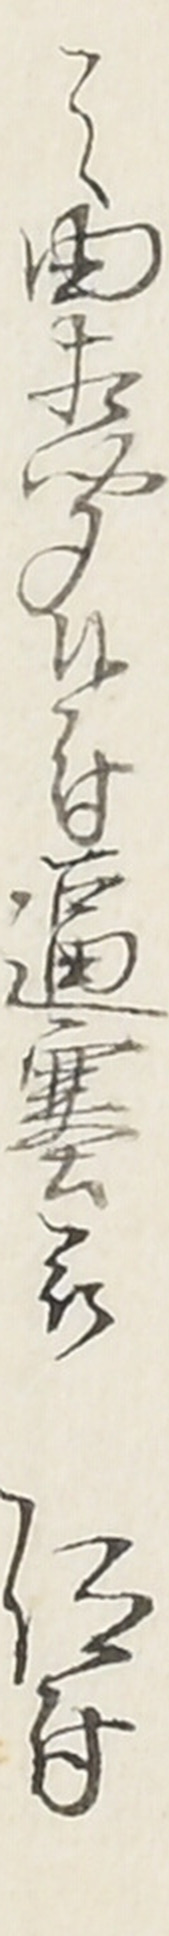之由相聞候付逼塞被仰付
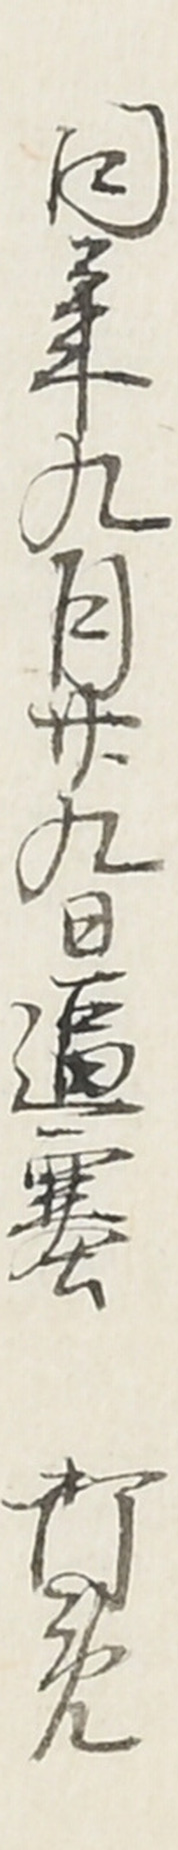一同年九月廿九日逼塞御免
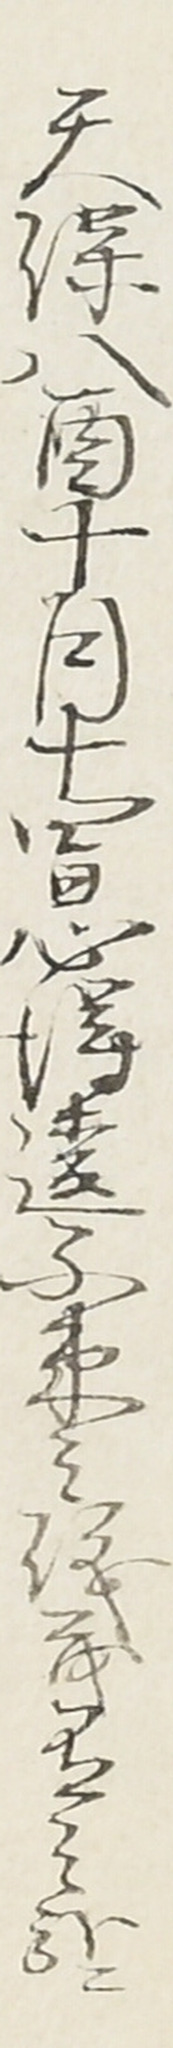一天保八酉十月十四日心得違不束之儀茂有之哉ニ
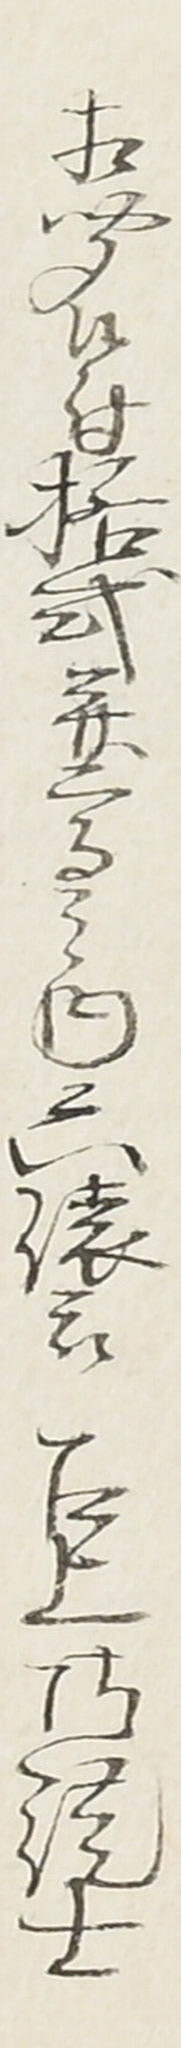相聞候付格式并高之内六俵被召上御徒士
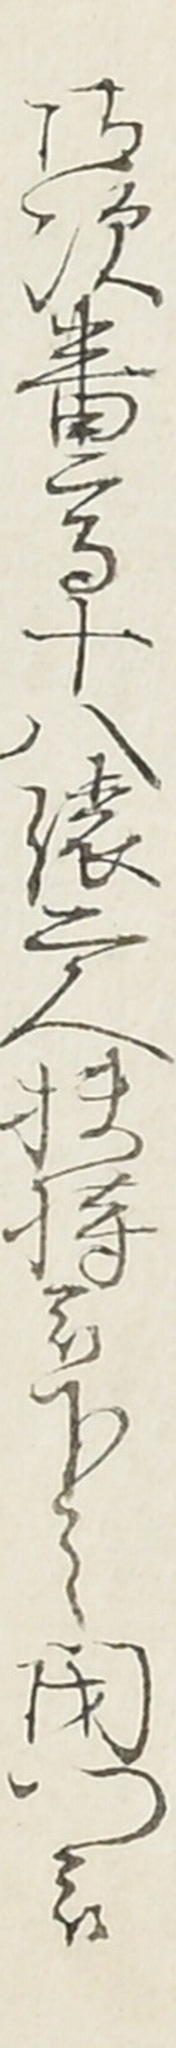御次番高十八俵二人扶持被下之閉門被
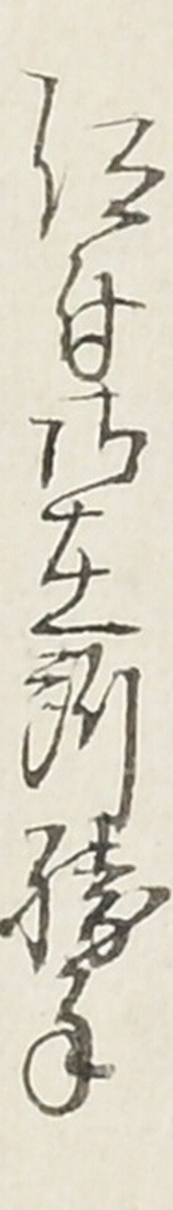仰付御在所勝手
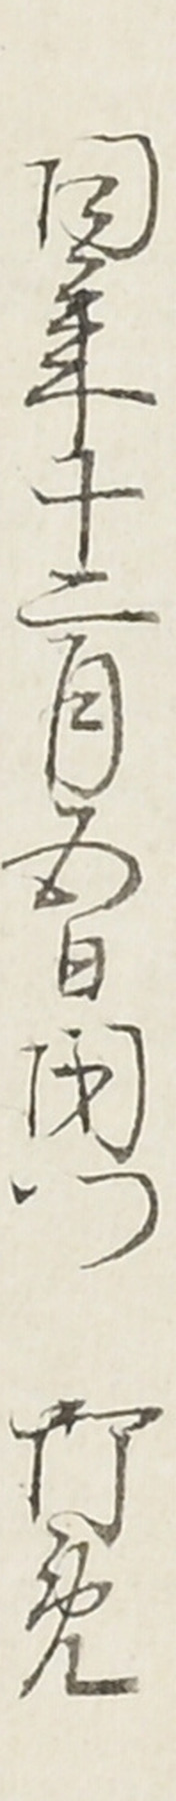一同年十二月五日閉門御免
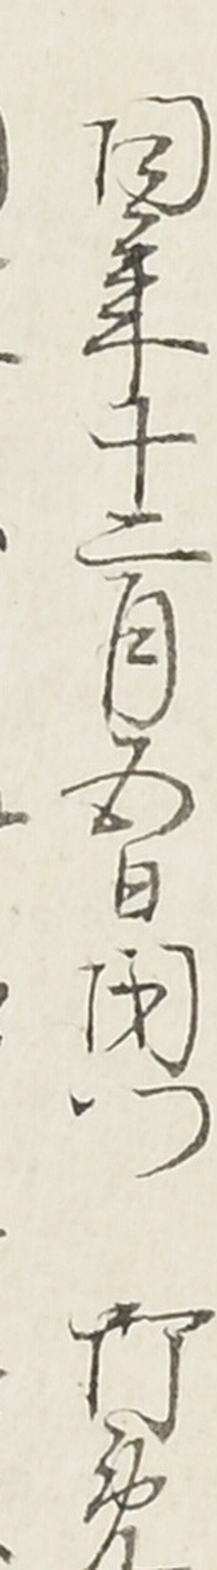一同年十二月五日閉門御免
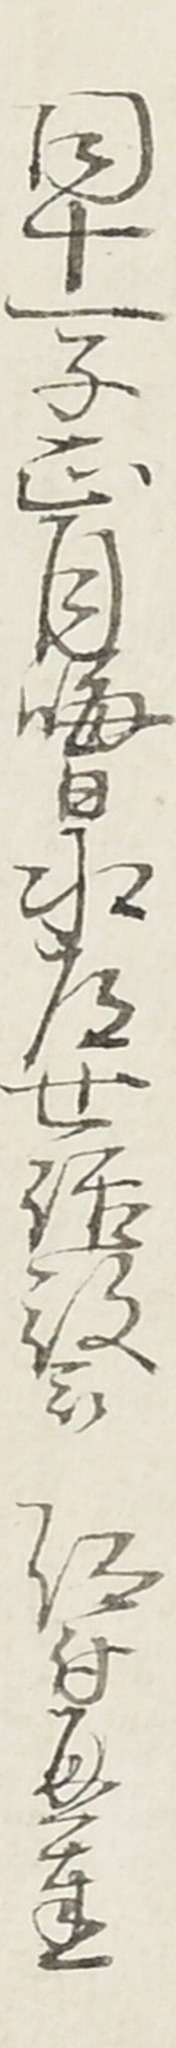一同十一子正月晦日水道世話役被仰付通達
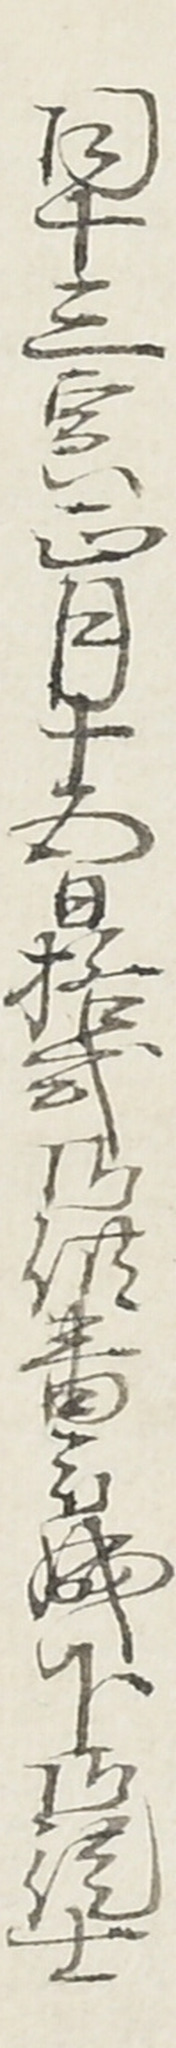一同十三寅正月十五日格式御供番被成下御徒士
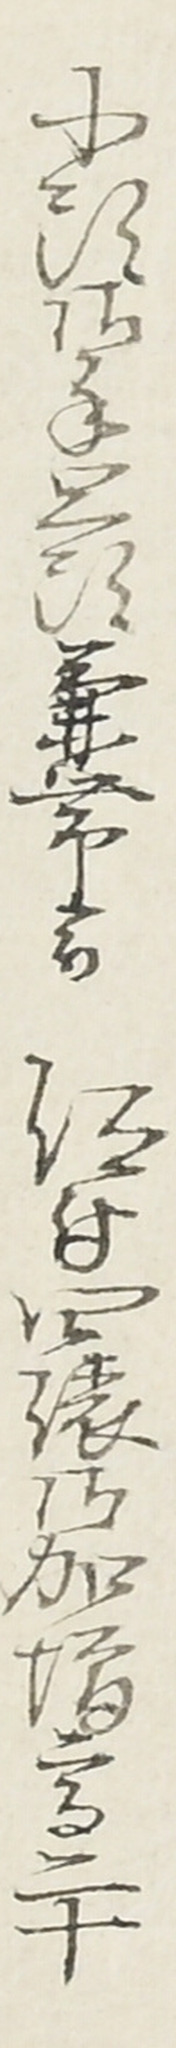小頭御手廻頭兼帯被仰付四俵御加増高二十
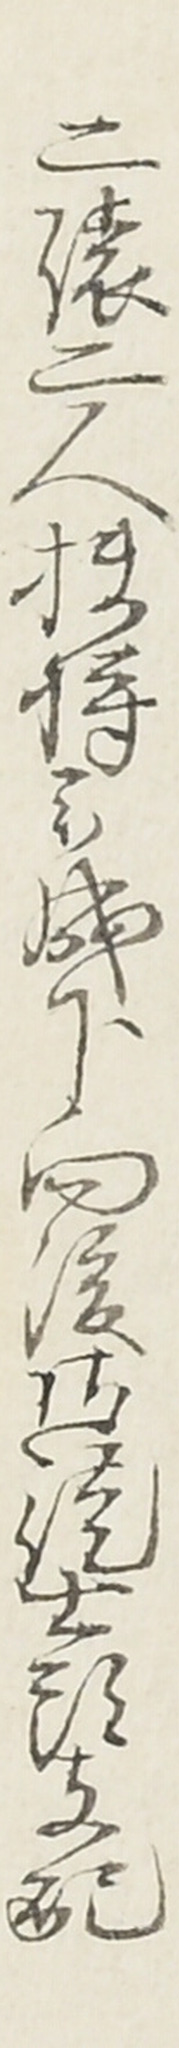二俵二人扶持被成下向後御徒士頭支配
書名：無足諸士勤仕録（四）
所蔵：伊那市立高遠町図書館・合同会社AMANE
